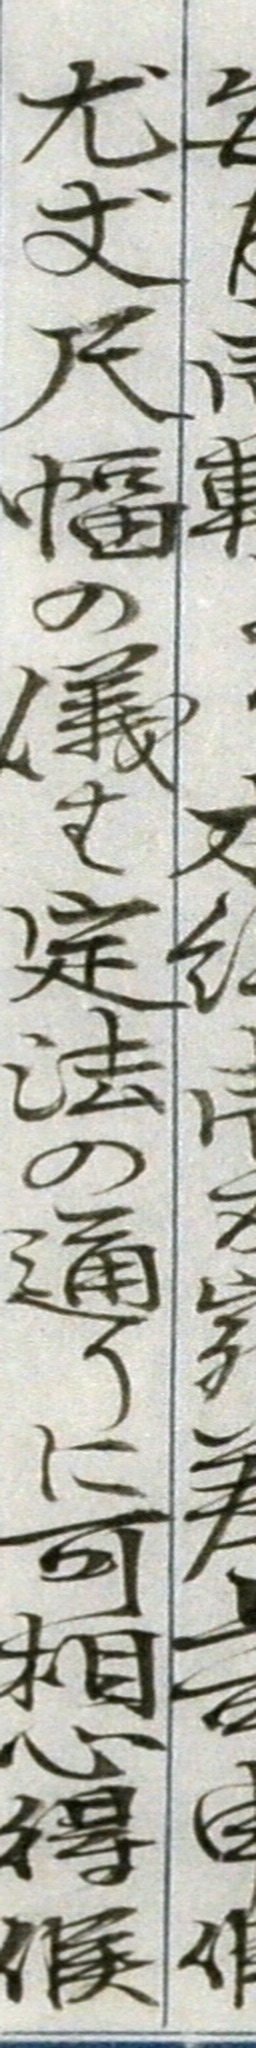尤丈尺幅の儀は定法の通りに可相心得候
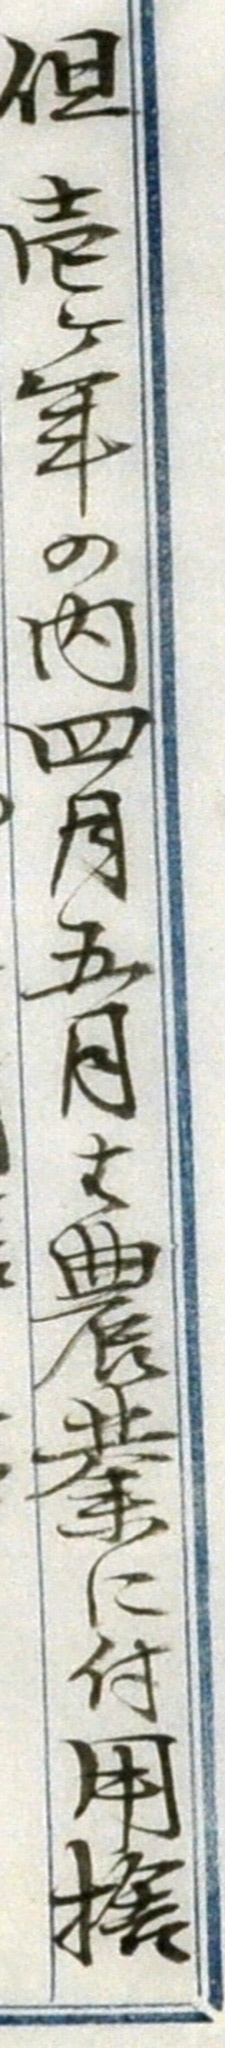但壱ヶ年の内四月五月は農業に付用捨
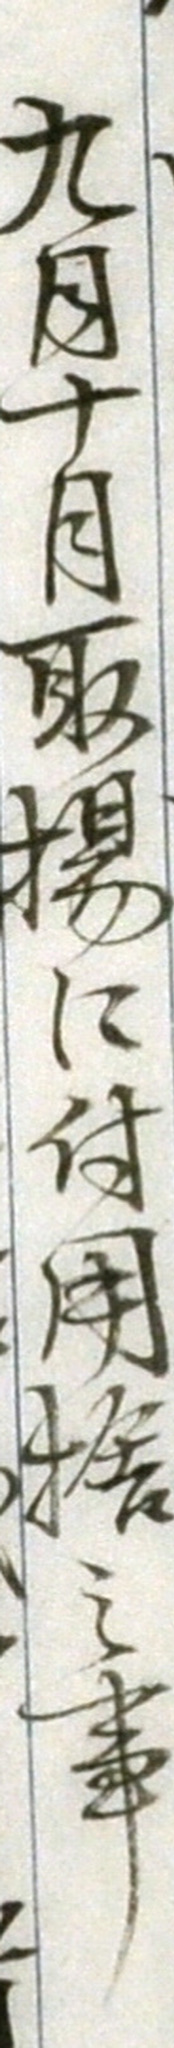九月十日取揚に付用捨之事
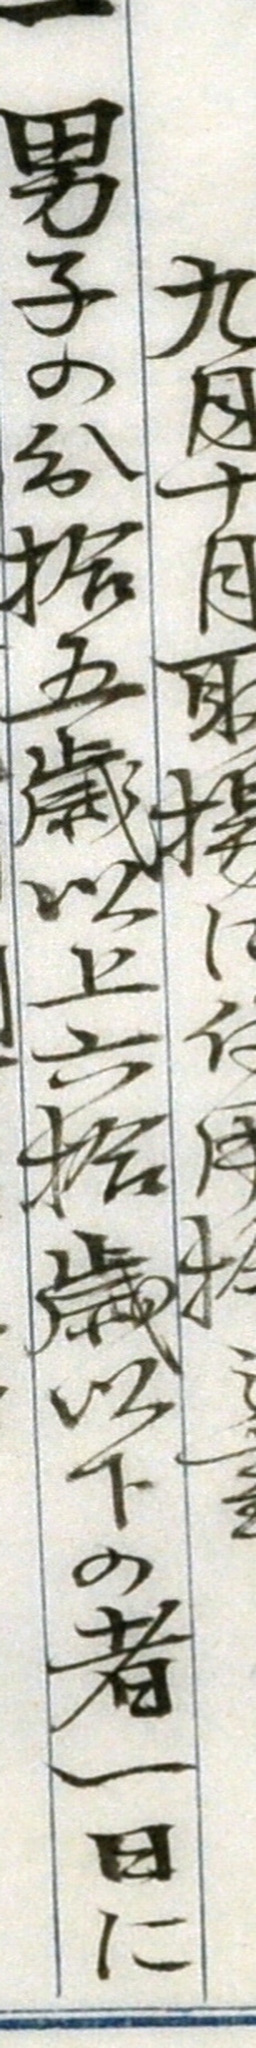一男子の分拾五歳以上六拾歳以下の者一日に
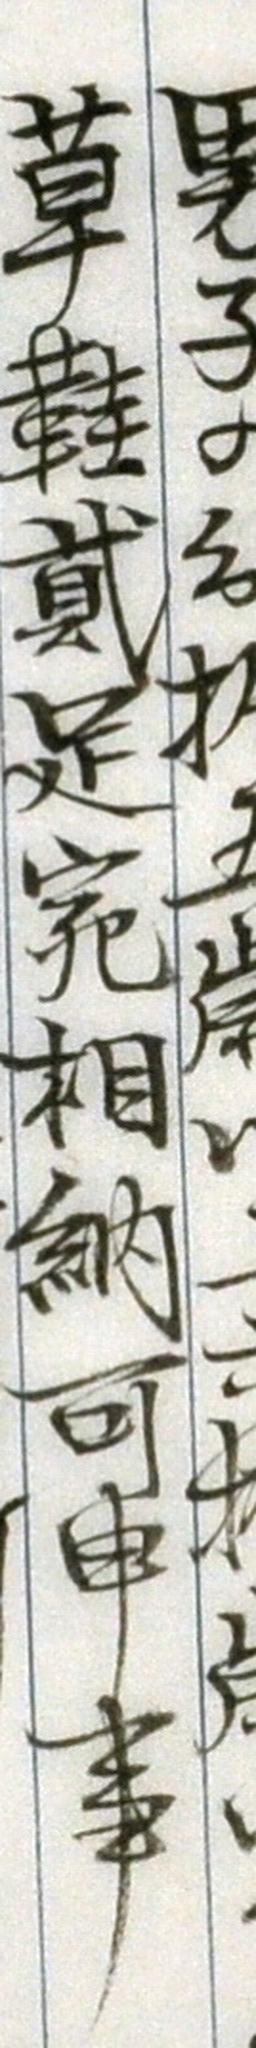草鞋弐足宛相納可申事
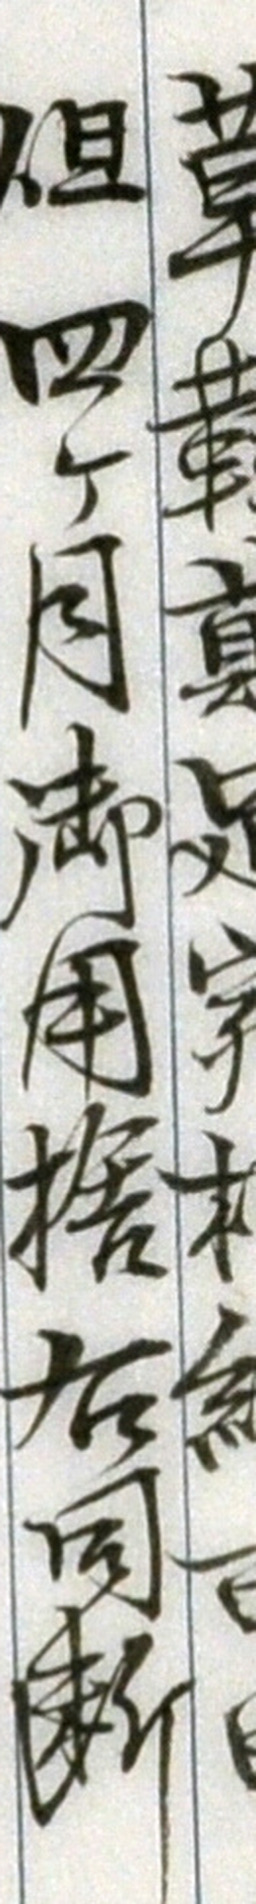但四ヶ月御用捨右同断
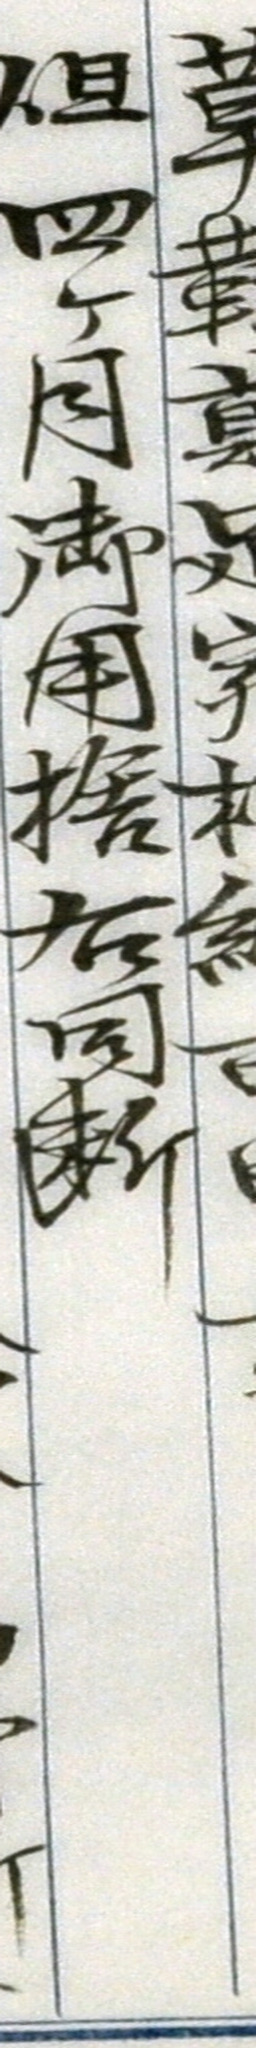但四ヶ月御用捨右同断
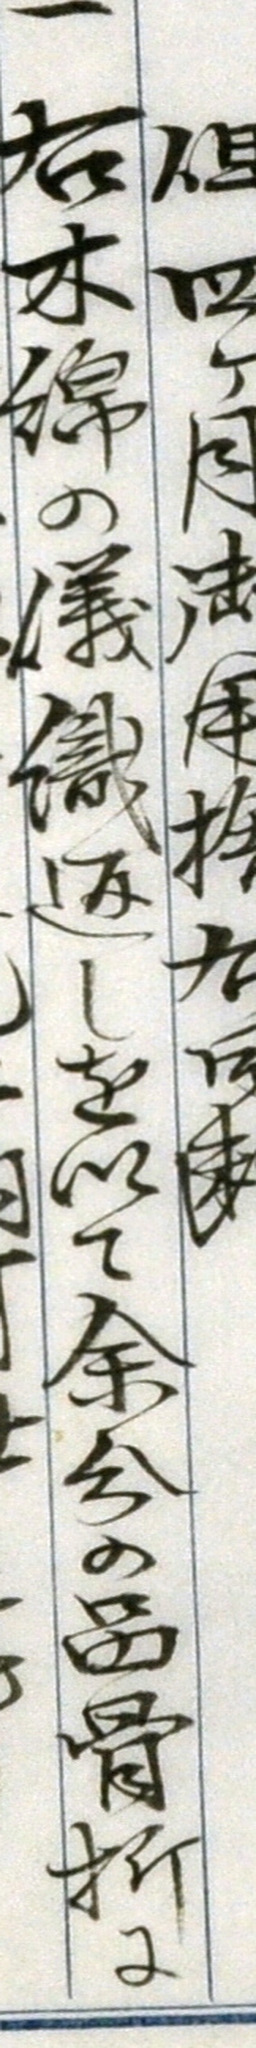一右木綿の儀織返しを以て余分の品骨折に
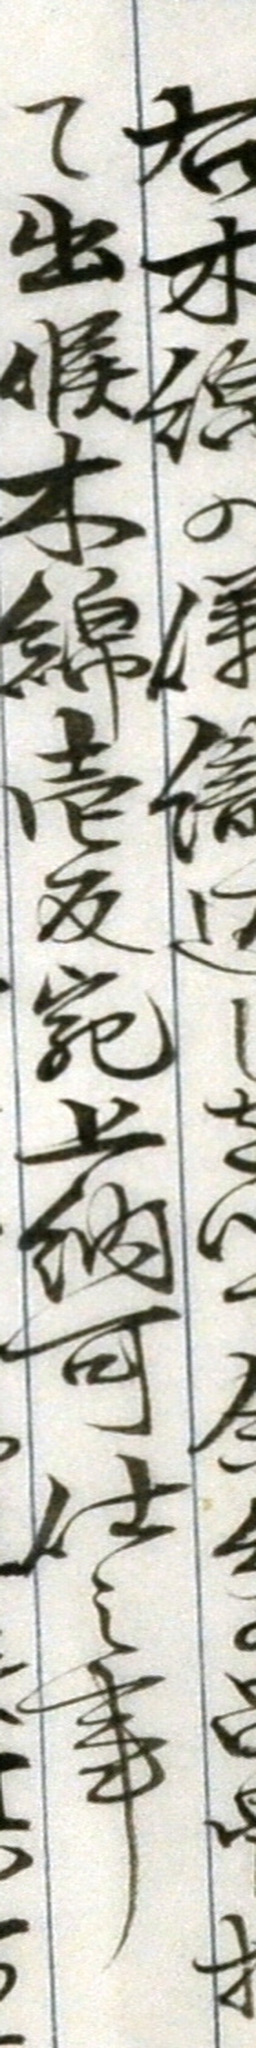て出候木綿壱反宛上納可仕之事
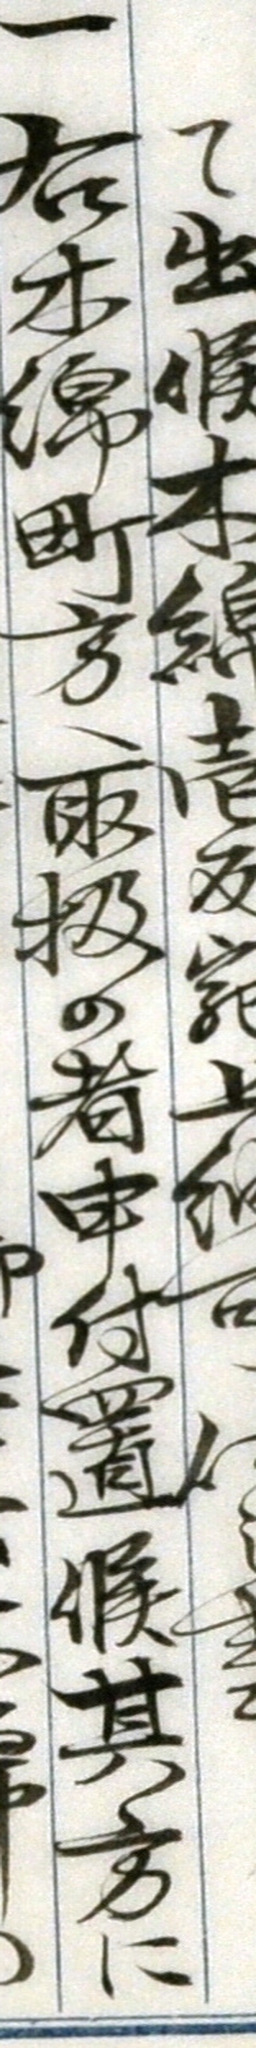一右木綿町方へ取扱の者申付置候其方に
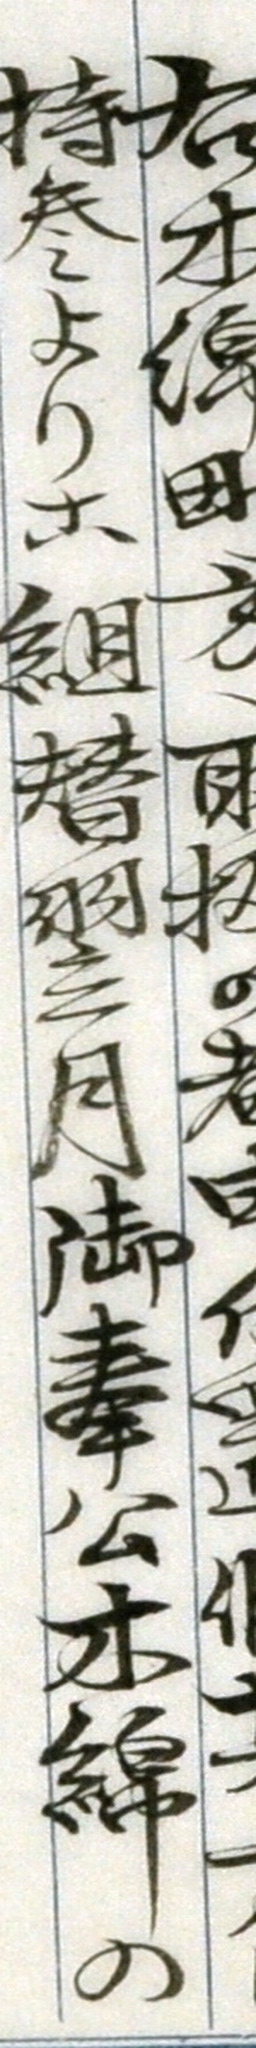持参より古組替翌月御奉公木綿の
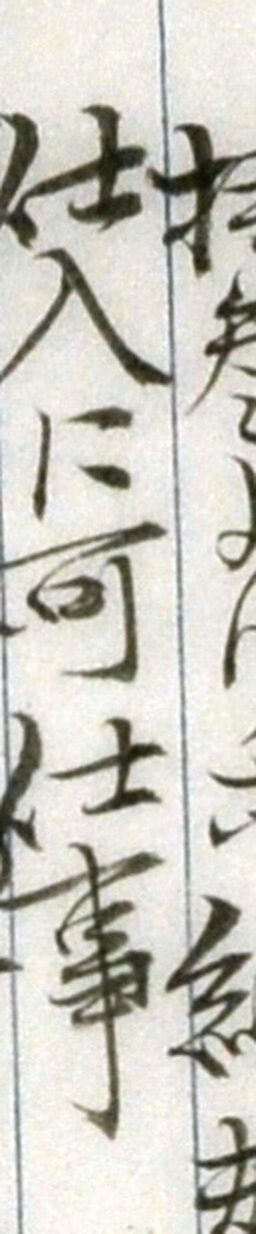仕入に可仕事
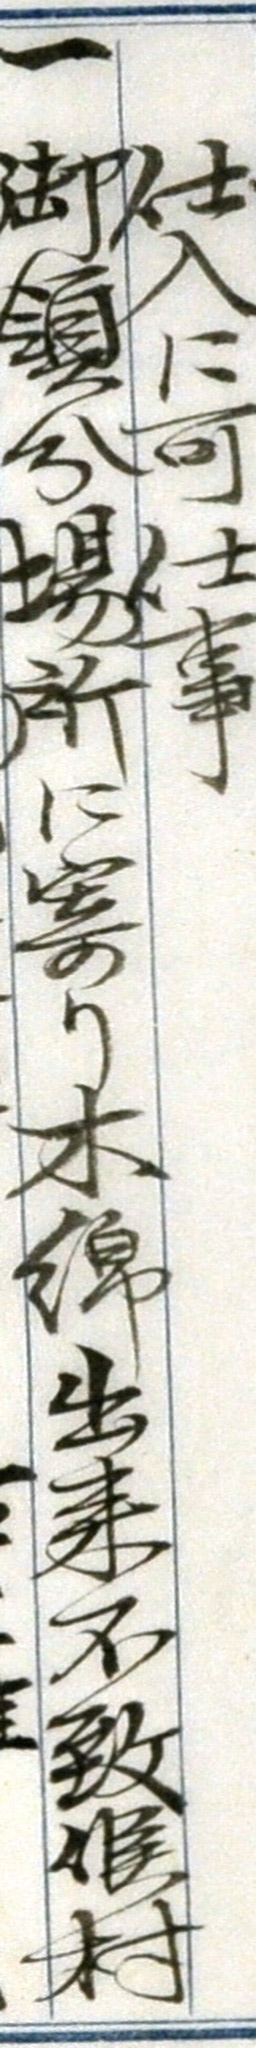一御領分場所に寄り木綿出来不致候村
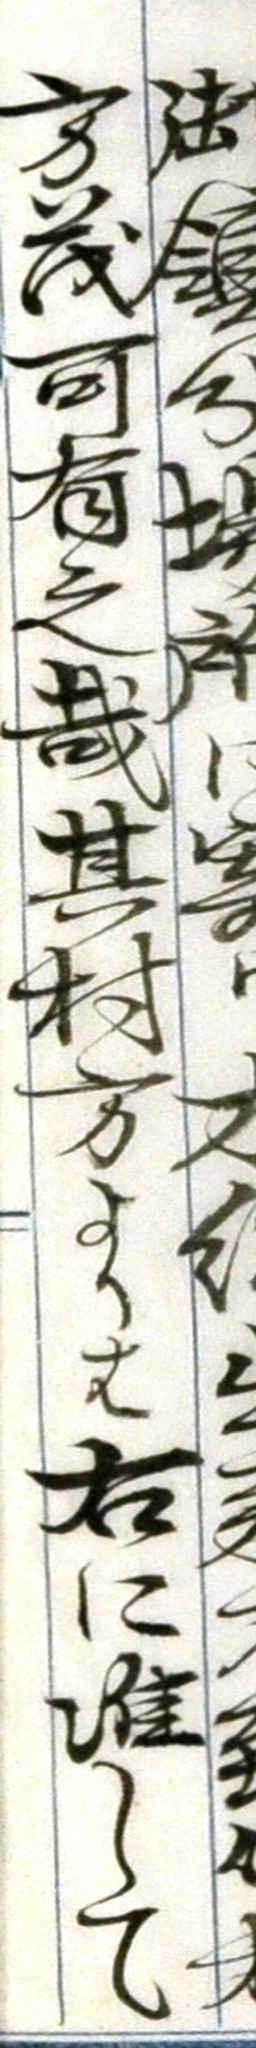方茂可有之哉其村方よりは右に准して

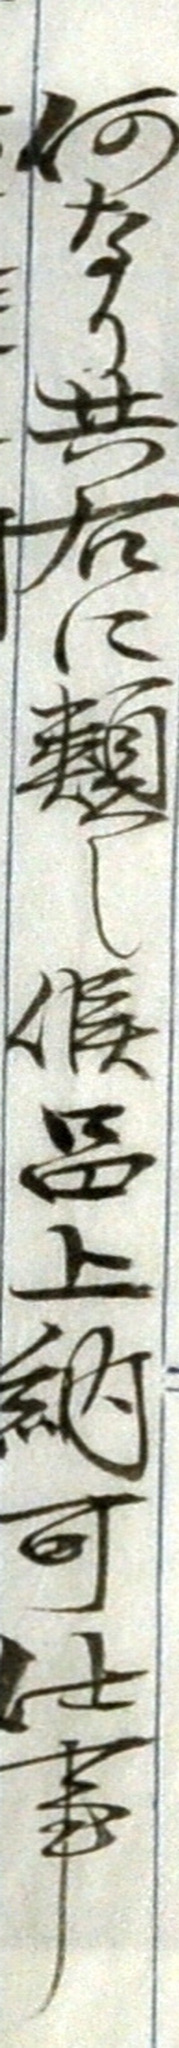何なり共右に類し候品上納可仕事
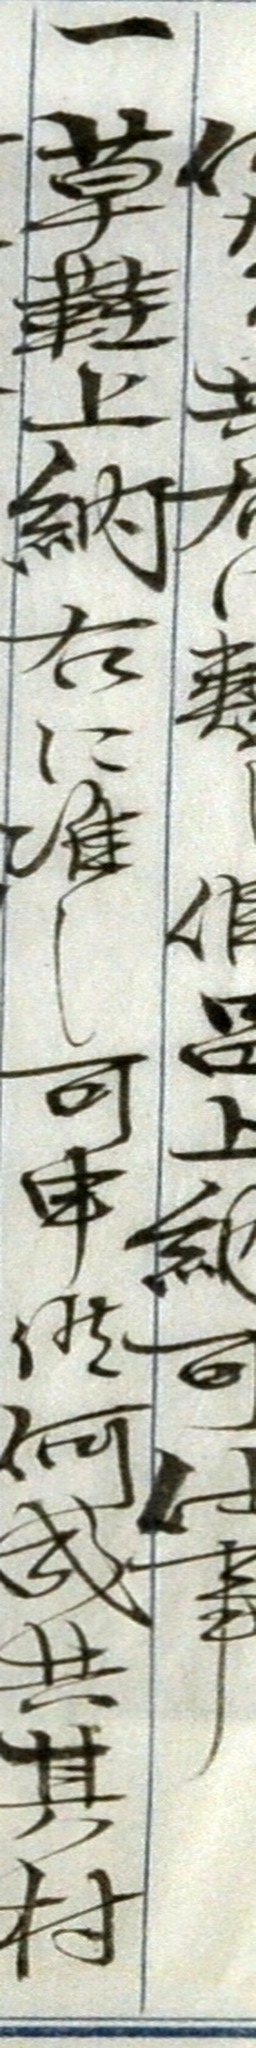一草鞋上納右に准し可申候何成共其村
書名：倹約筋御沙汰書
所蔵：伊那市立高遠町図書館・合同会社AMANE
